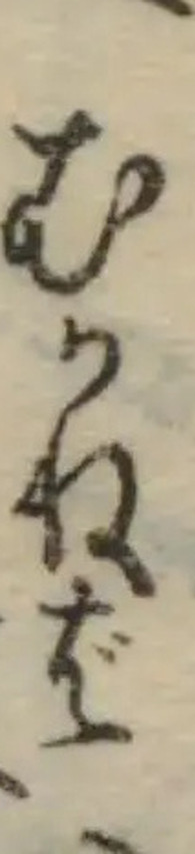むかねば
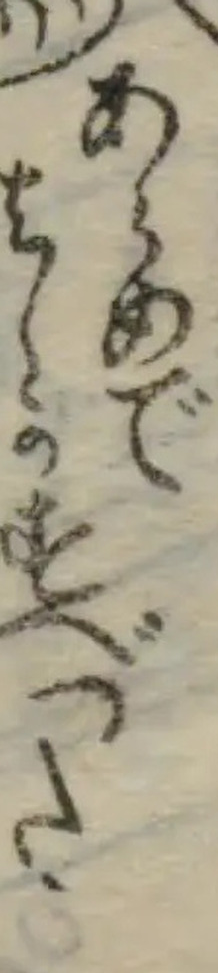あしかすべつた
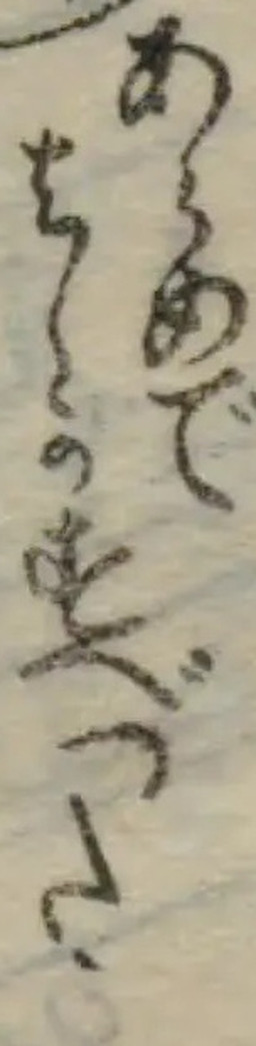あしかすべつた
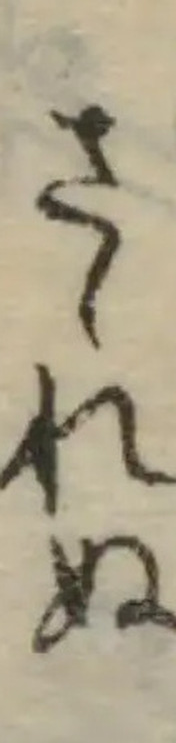さゝれぬ
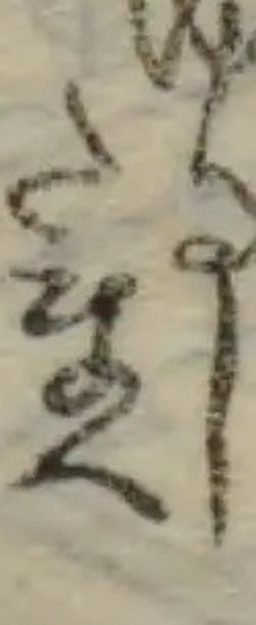たまへ
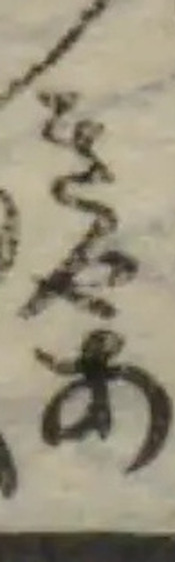きやあ
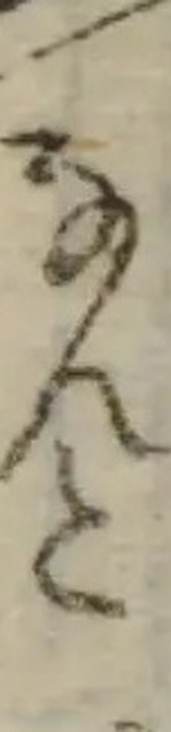なんと
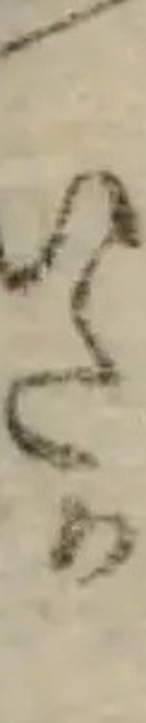いたか
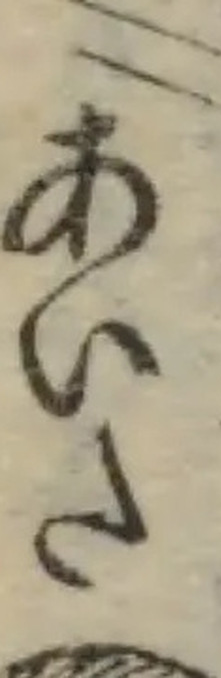あいた
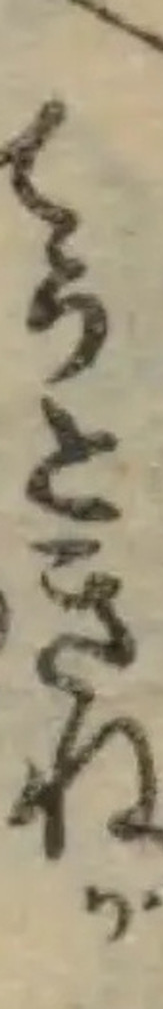てうときねが
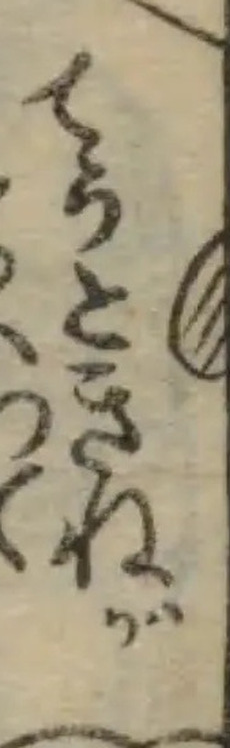てうときねが
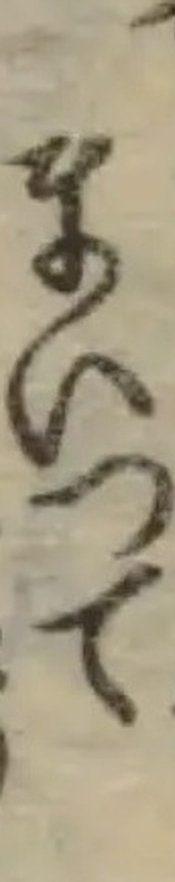まいつて
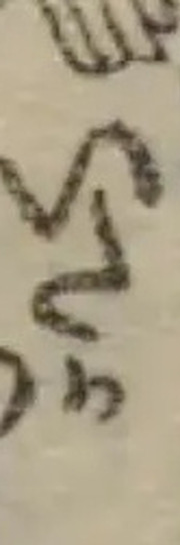いたか
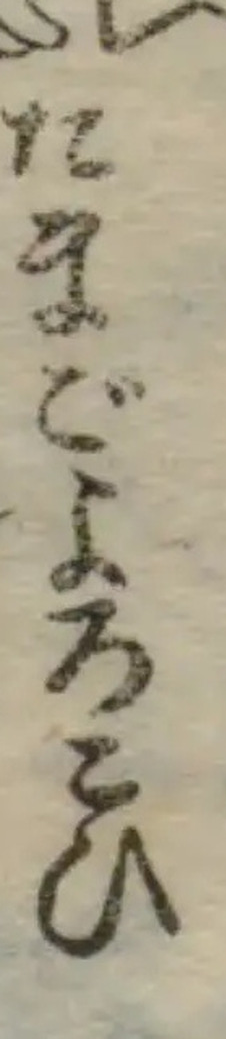たまごよろこひ
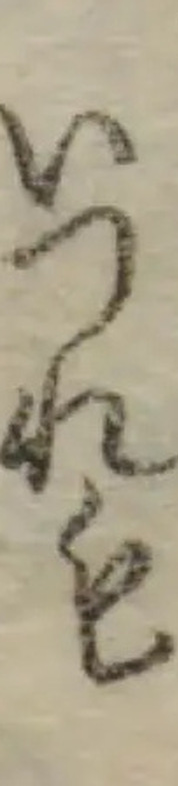いつれも
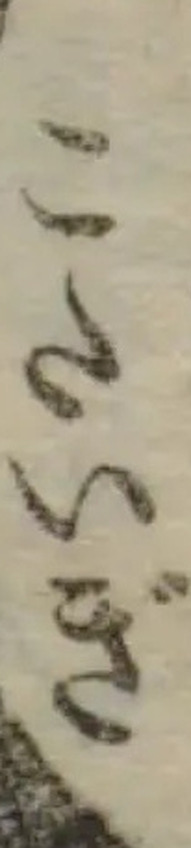こたいぎ
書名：さるかに合戦
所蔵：国立国会図書館 National Diet Library, JAPAN
